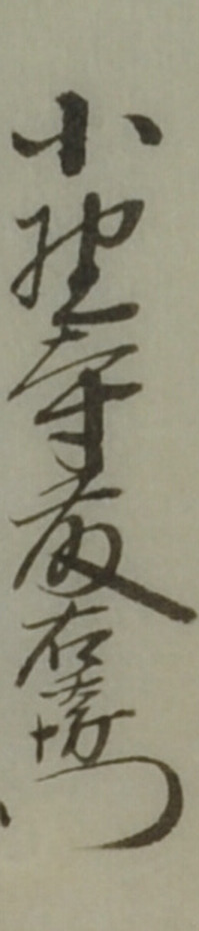小野寺籐右衛門
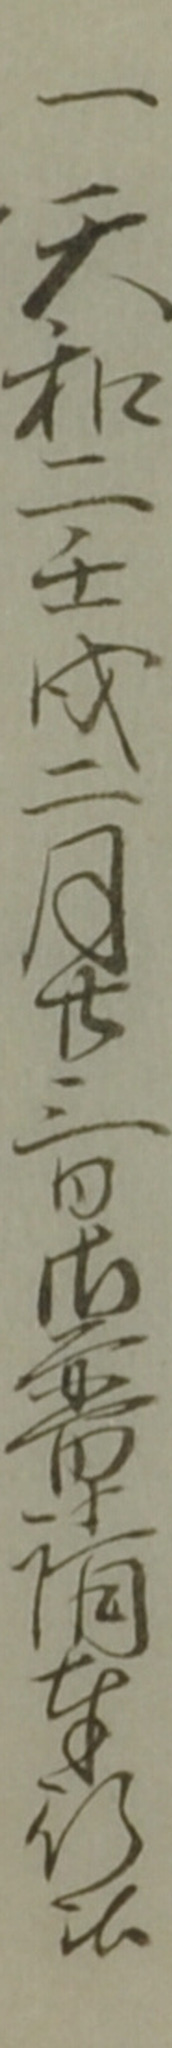一天和二壬戌二月廿三日御普請奉行被
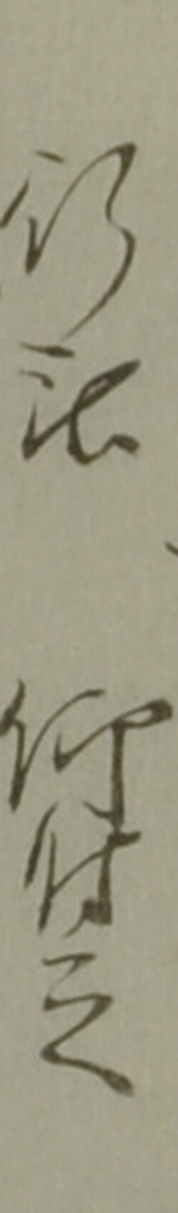行被仰付之
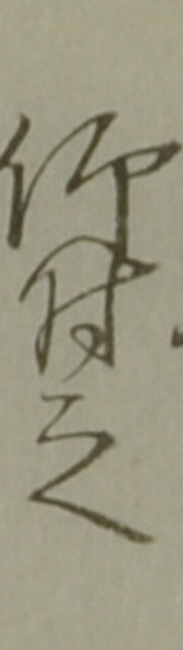仰付之
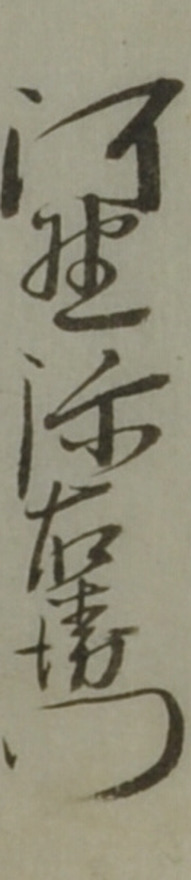河野添右衛門
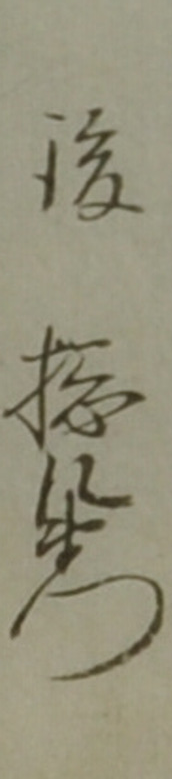後総左衛門
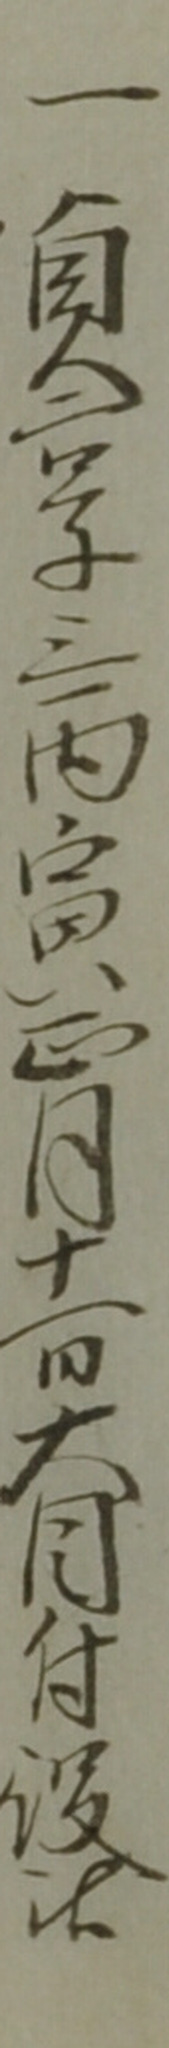一貞享三丙寅正月十一日大目付役被
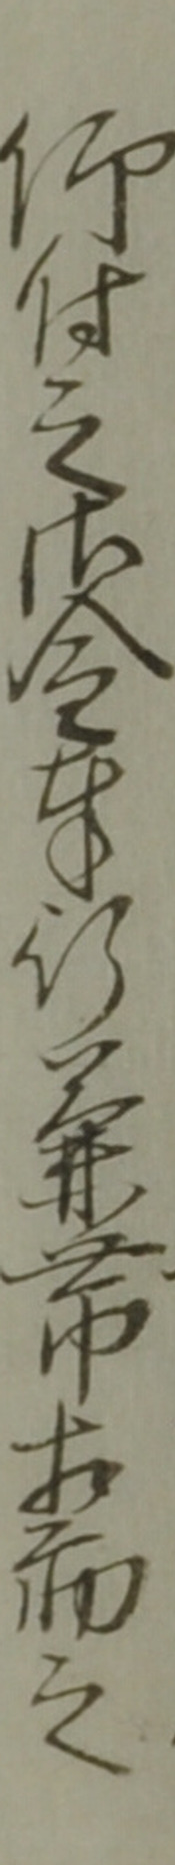仰付之御金奉行兼帯相勤之
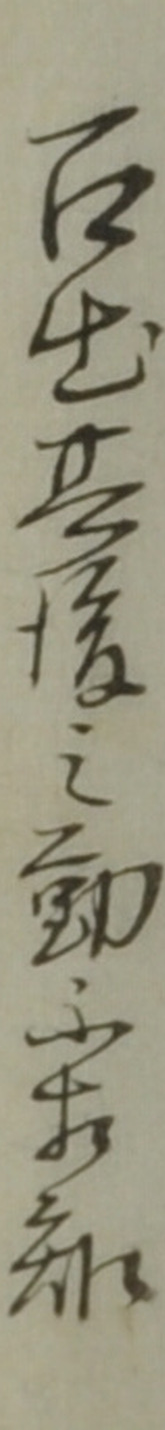召出其後之勤付相知
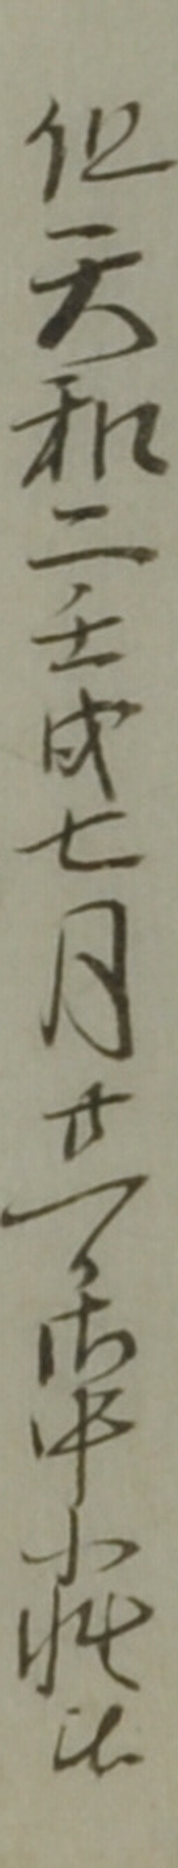但天和二壬戌七月廿一日御中小性被

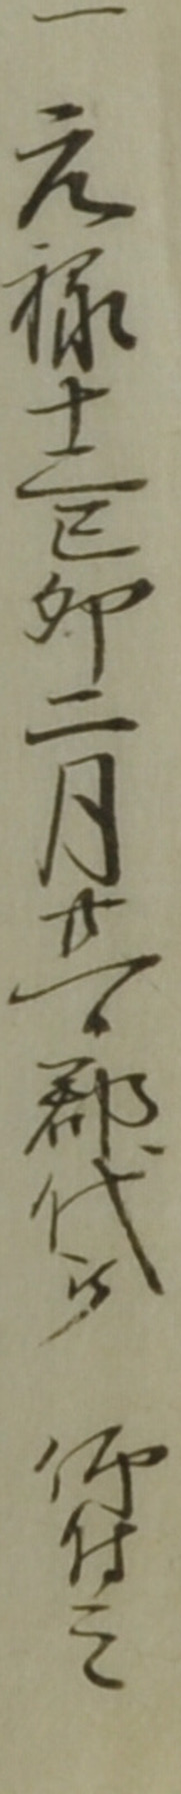一元禄十二己卯二月廿一日郡代被仰付之
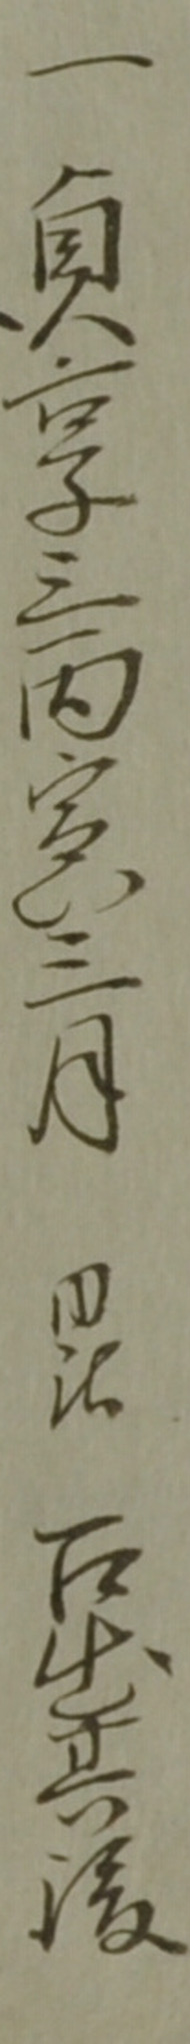一貞享三丙寅三月日被召出其後
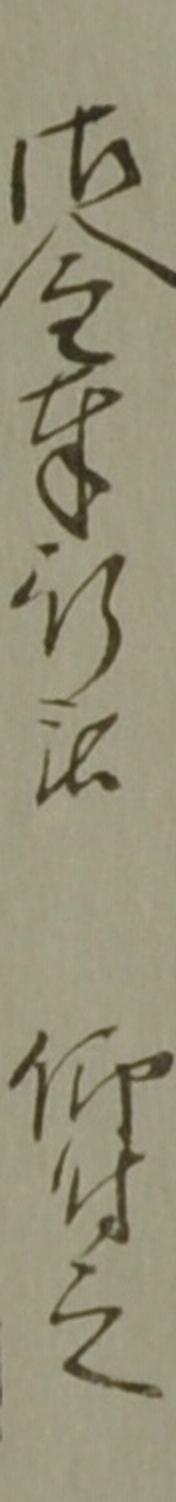御金奉行被仰付之
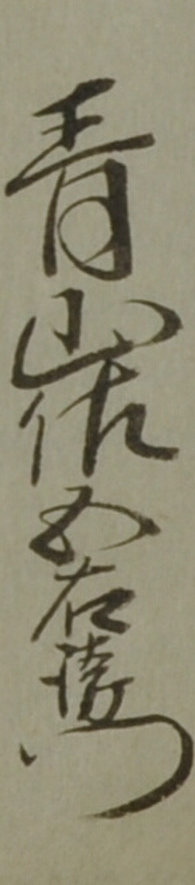青山佐五右衛門
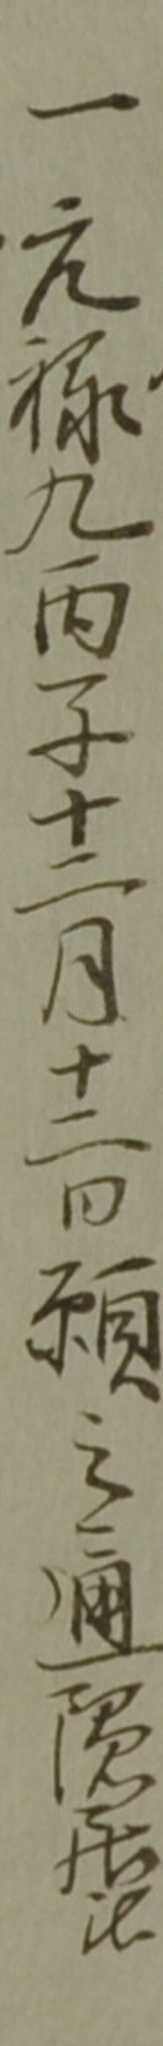一元禄九丙子十二月十二日願之通隠居被
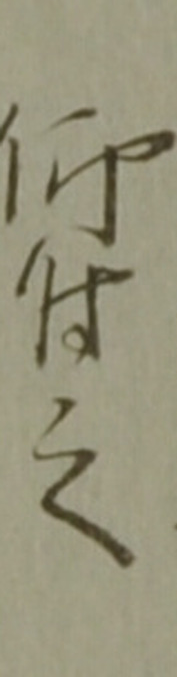仰付之
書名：諸御役代々録（七）
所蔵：伊那市立高遠町図書館・合同会社AMANE
